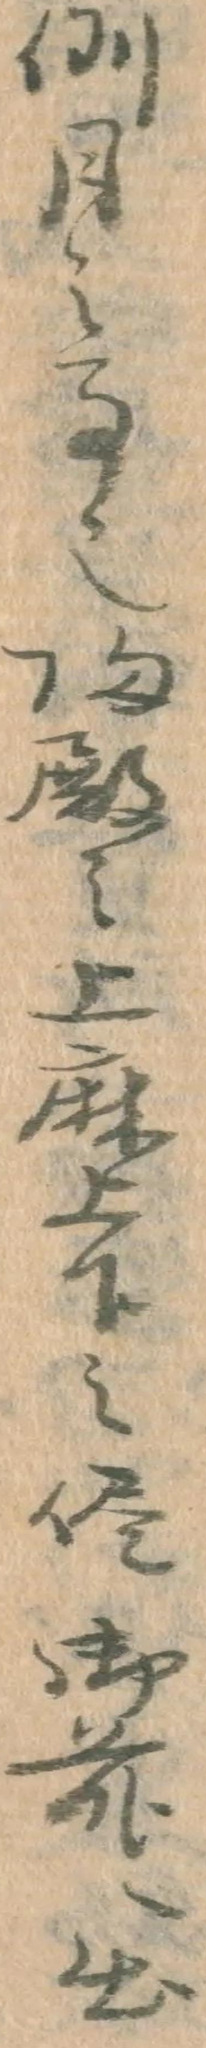例月之事也、帰殿之上、麻上下之侭御前へ出、
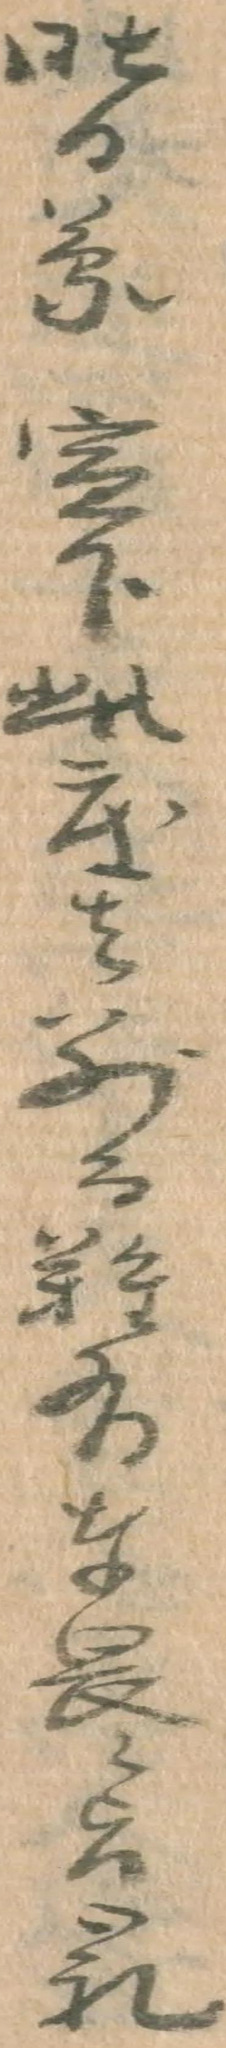昨日蒙宣下、此度者別而難有奉畏候旨御礼
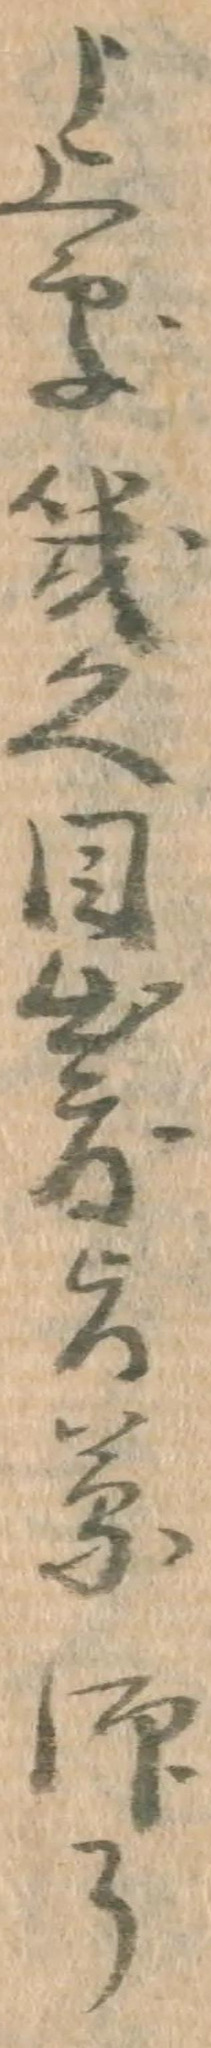申上處、幾久目出度旨蒙仰了、
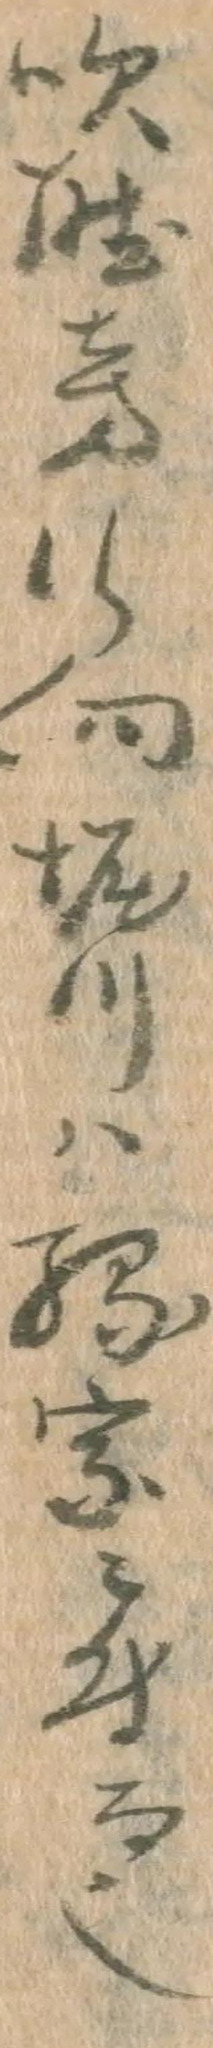吹聴旁行向、堀川ハ縁家ニ付而也、
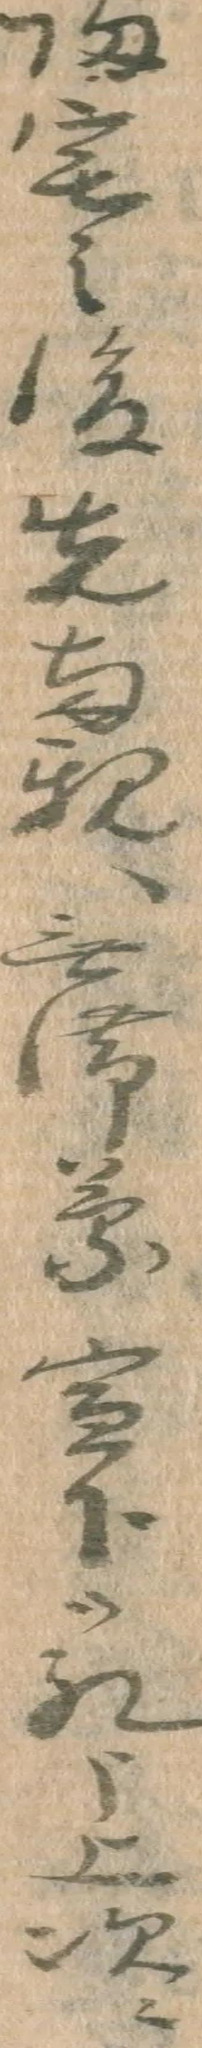帰宅之後、先両親へ無滞蒙宣下御礼申上、次ニ
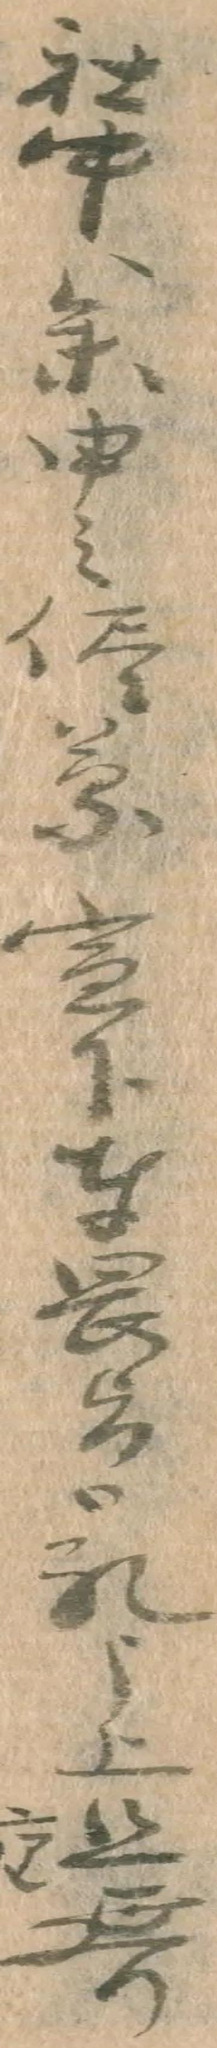社中ヘ参申之、侭蒙宣下奉畏旨御礼申上、且廻り
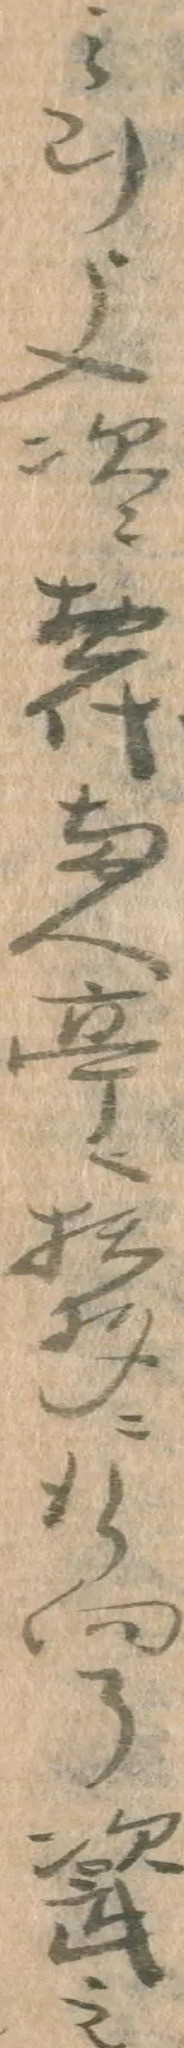之引申入、次ニ惣代両人亭へ挨拶ニ行向了、次重武之
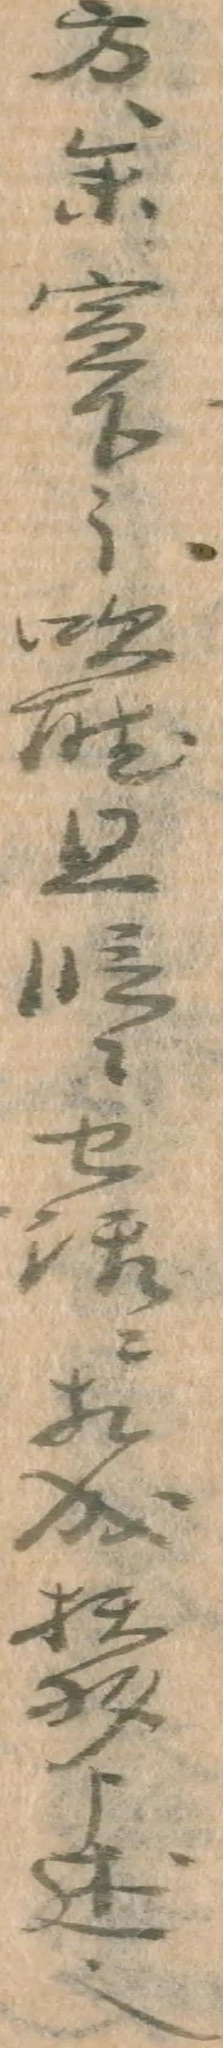方へ参、宣下之吹聴、且段々世話二相成挨拶申述也、
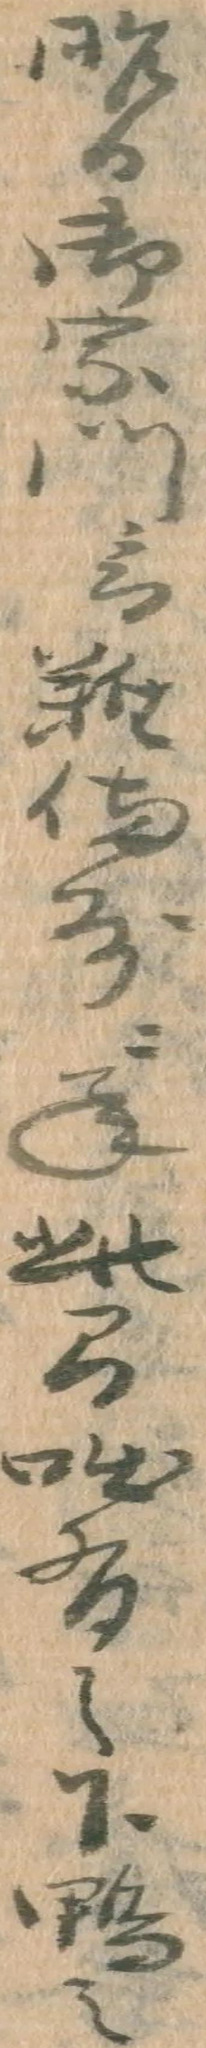昨日御家門ニ而難備前に承、此間咄有之、下鴨之
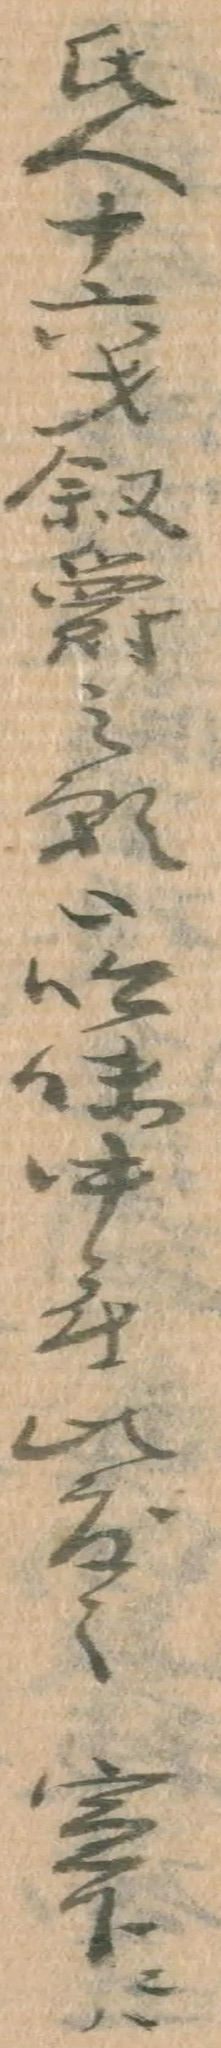氏人十六才叙爵之願御吟味中ニ付、此度々宣下ニハ
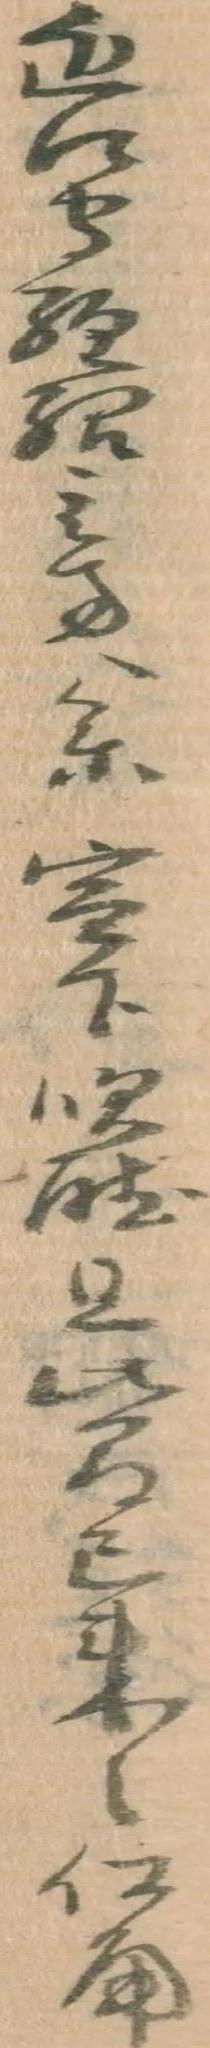近江守経招其方へ参、宣下吹聴、且此間已来之仕角
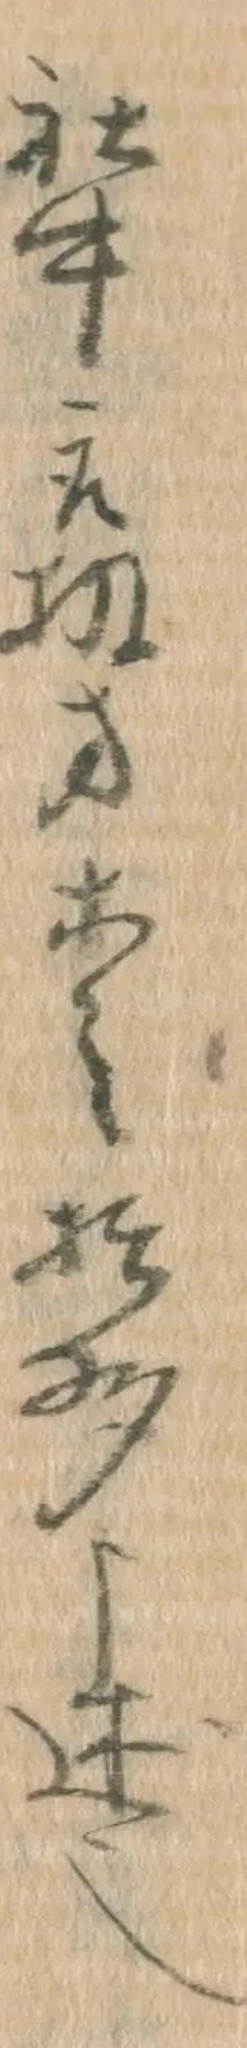社中取扱方等之挨拶申述也、
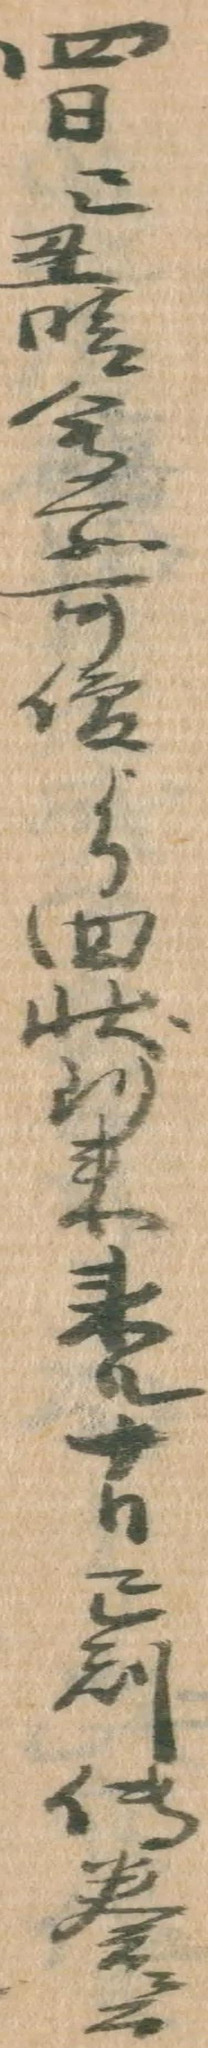四日已丑晴、會所可俊より回状到来、来ル十日巳刻傳奏ニテ
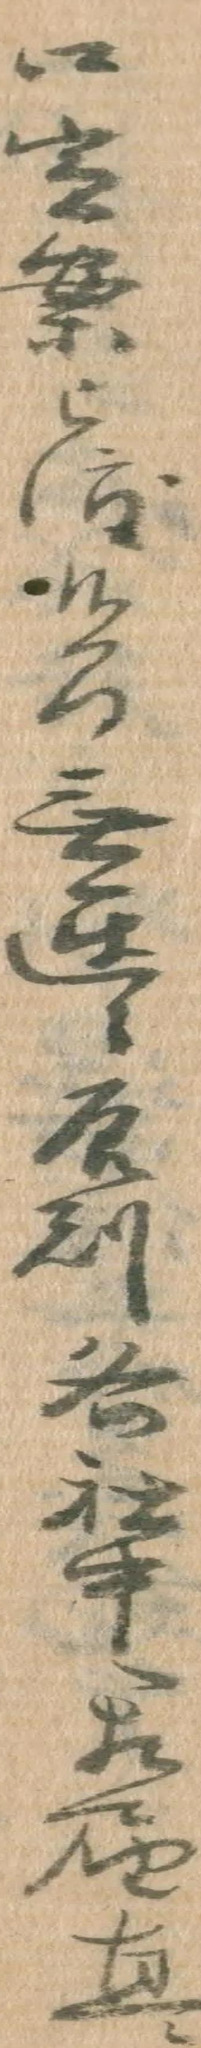口宣案被渡候間、無遅ニ辰刻各社中へ相届、直ニ
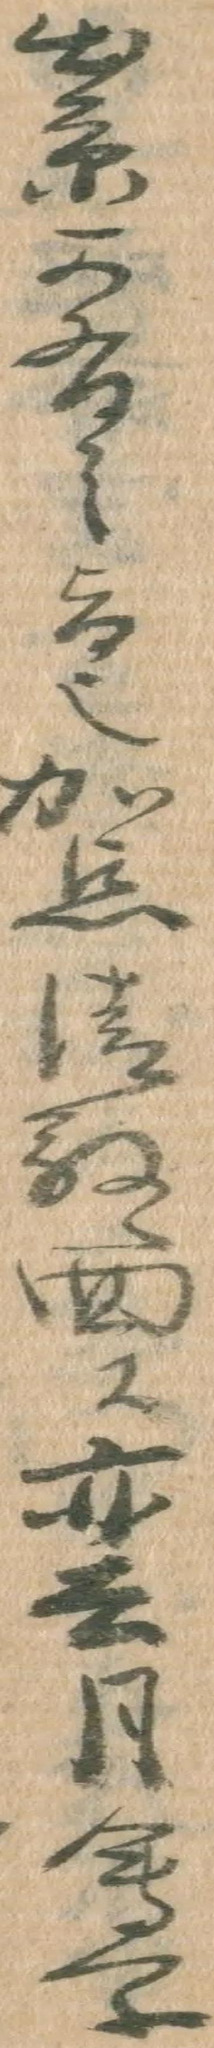出京可有之旨也、加点、清敬へ回ス、亦去月會所
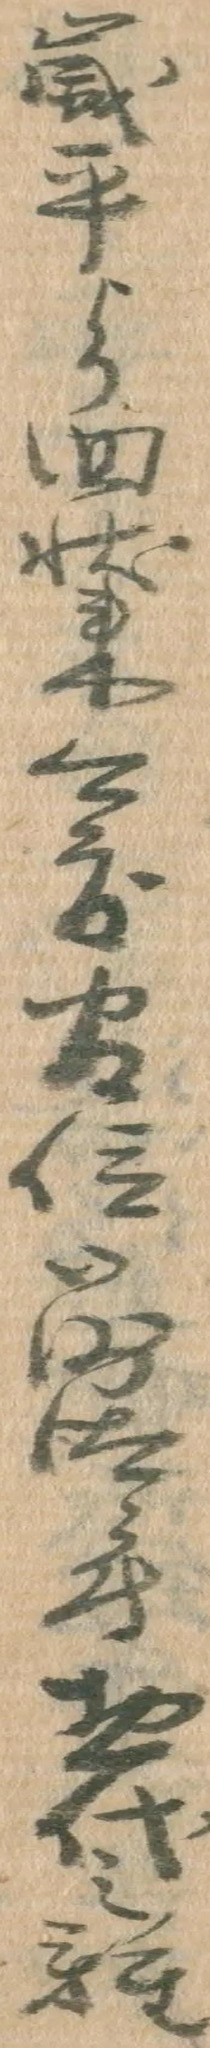歳平より回状来、今度官位御沙汰ニ付、惣代之雑
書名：賀茂社記録. 第63冊
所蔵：国立国会図書館 National Diet Library, JAPAN
